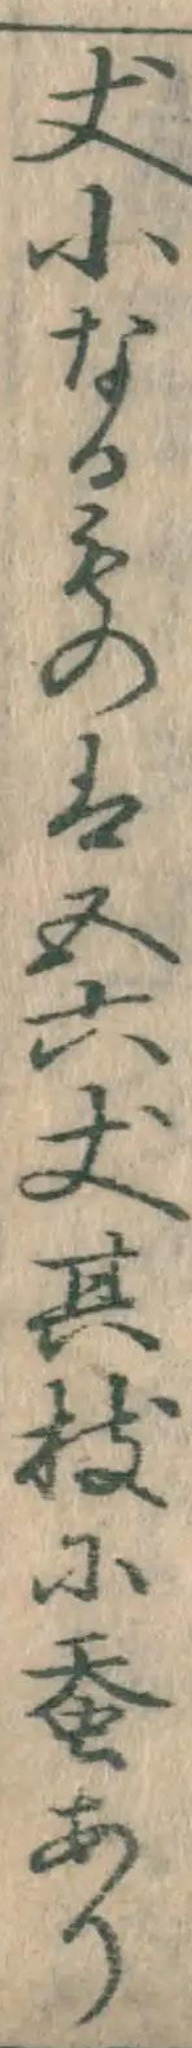丈小なるものは五六丈其枝に蚕あり

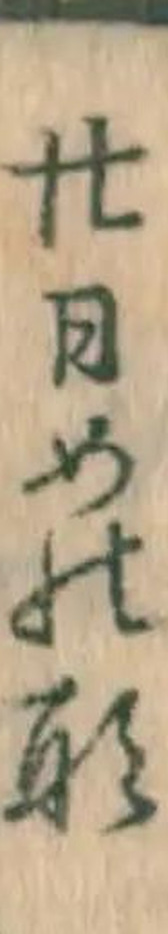廿日めの形
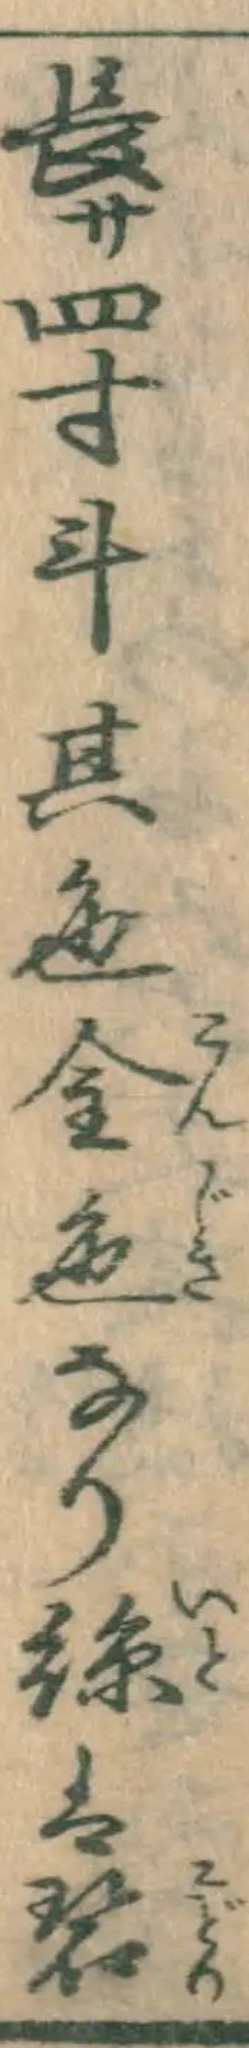長さ四寸斗其色金色なり糸は碧
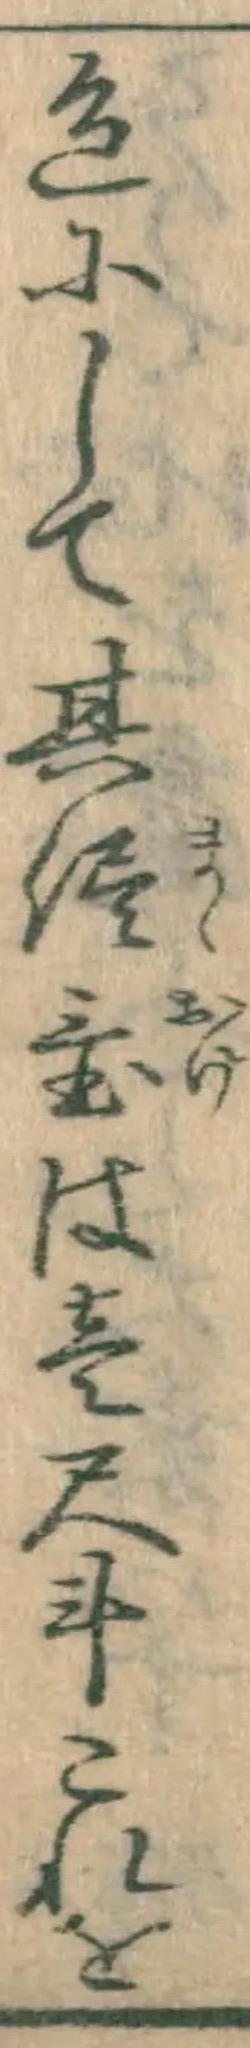色にして其侭置は壱尺斗これを
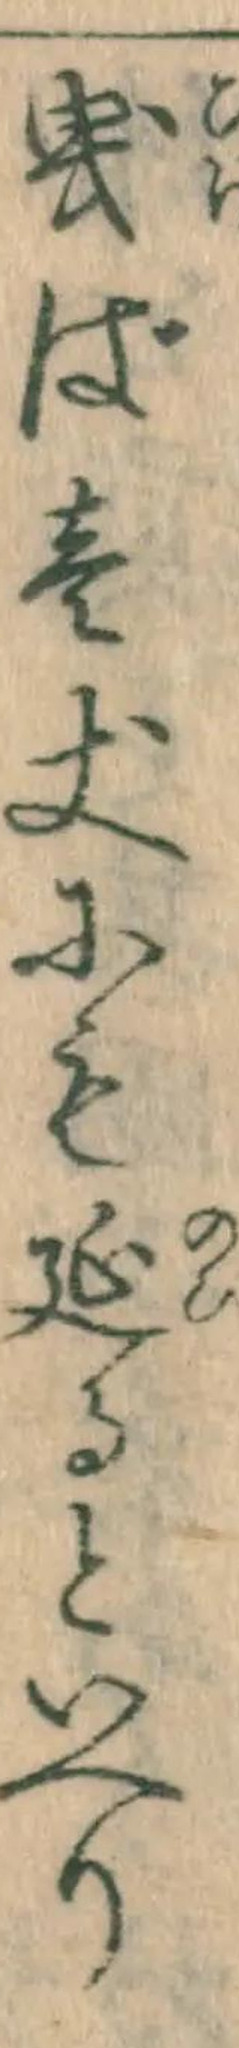曳ば壱丈にも延るといへり
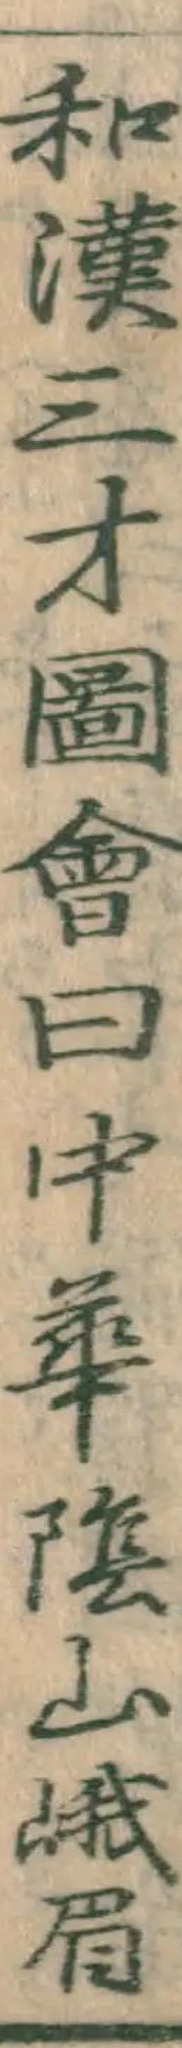和漢三才図会曰中華陰山峨眉
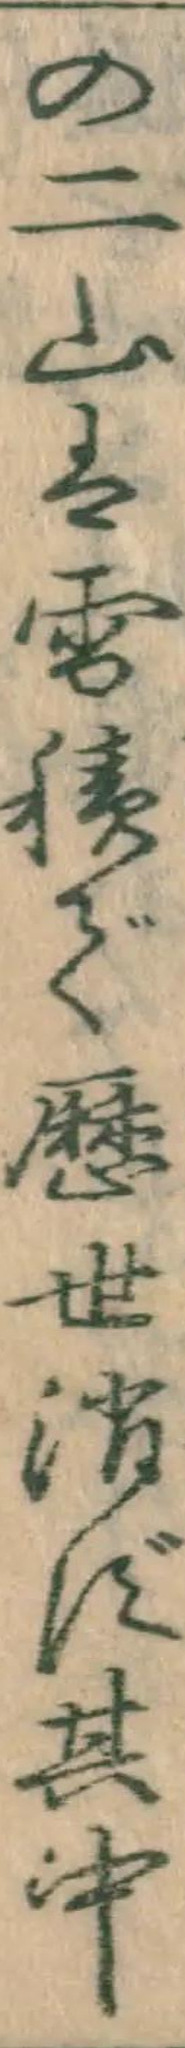の二山は雪積で歴世消ず其中
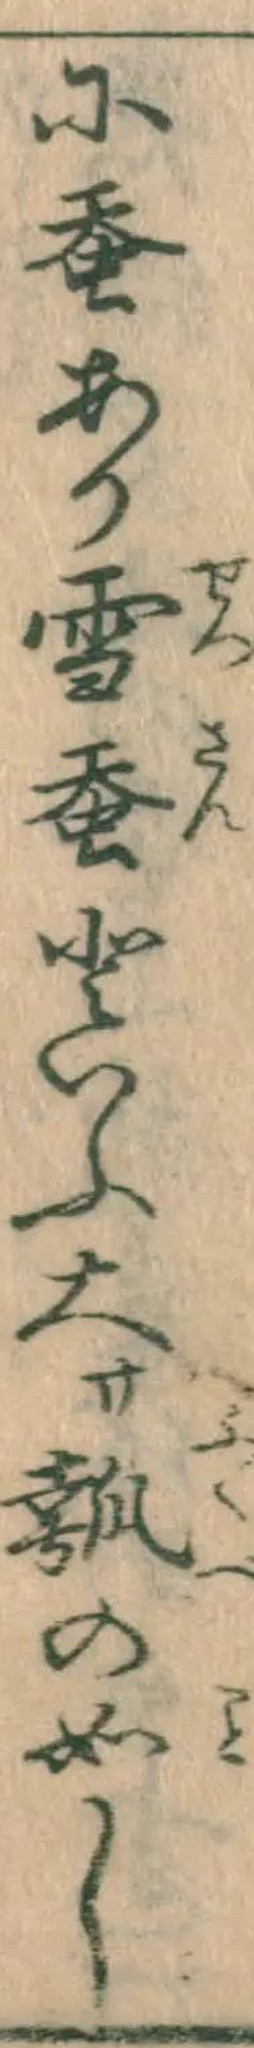に蚕あり雪蚕といふ大さ瓠の如し
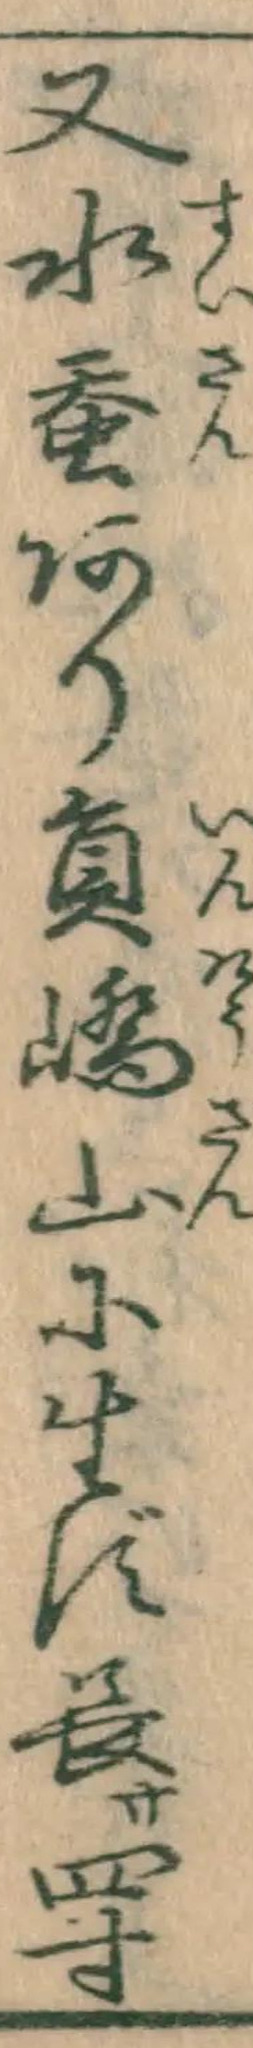又水蚕あり員嶋山に生ず長さ四寸
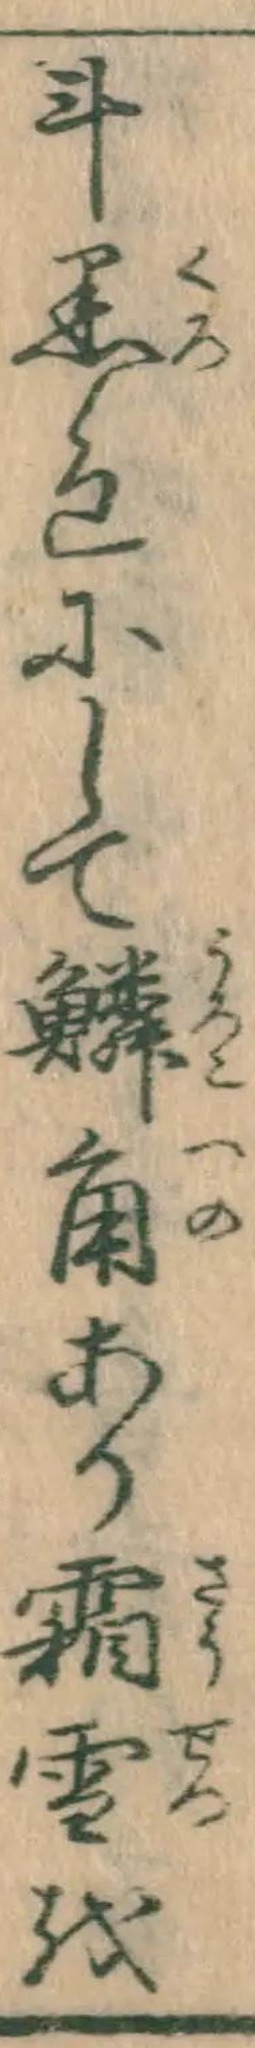斗黒色にして鱗角あり霜雪を
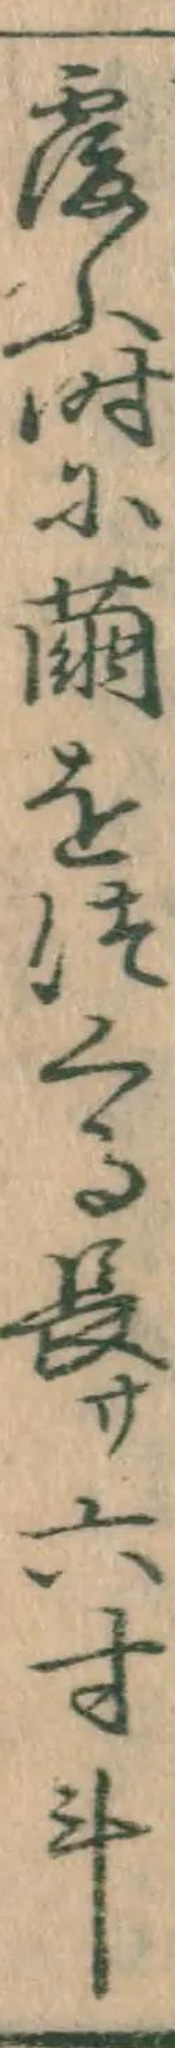覆ふ時に繭をつくる長さ六寸斗
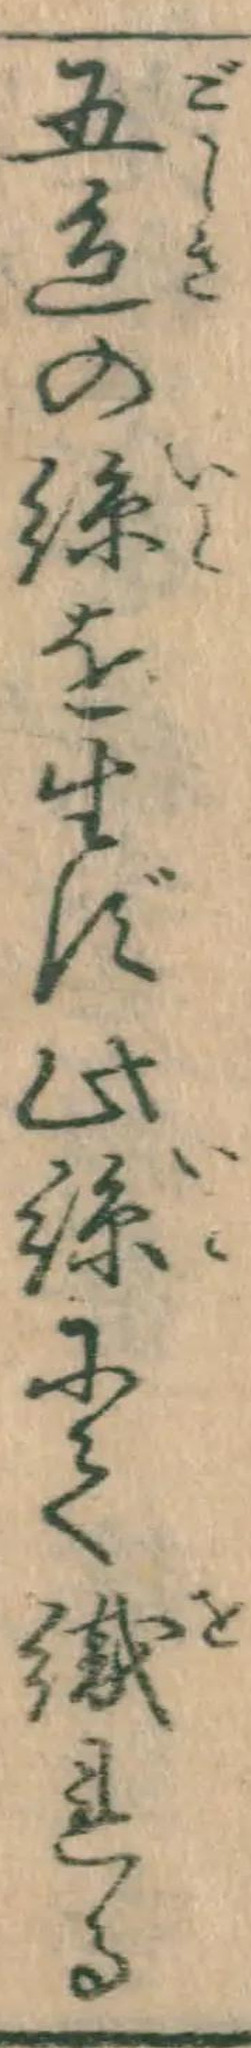五色の糸を生ず此糸にて織れる
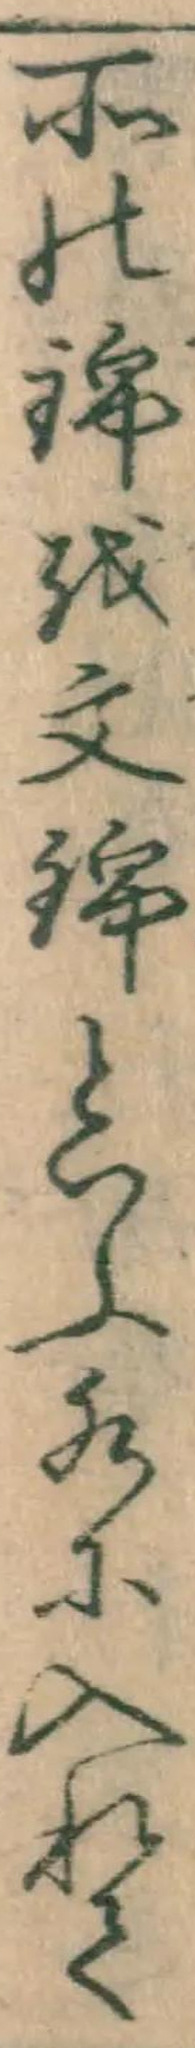所の錦を文錦といふ水に入れて
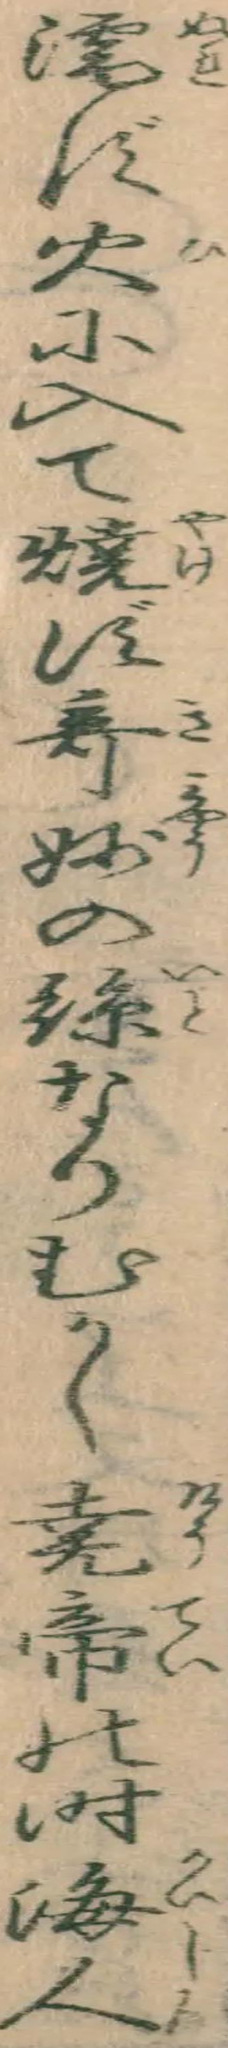濡ず火に入て焼ず奇妙の糸なりむかし堯帝の時海人
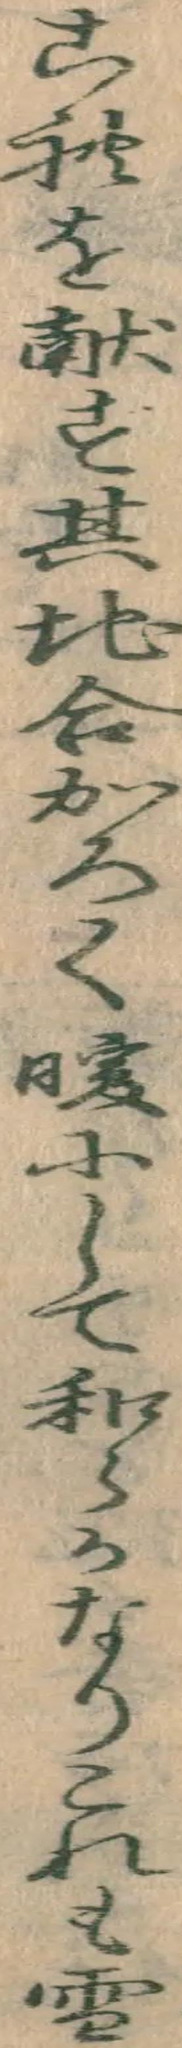これを献ず其地合かろく暖にして和らかなりこれも雪
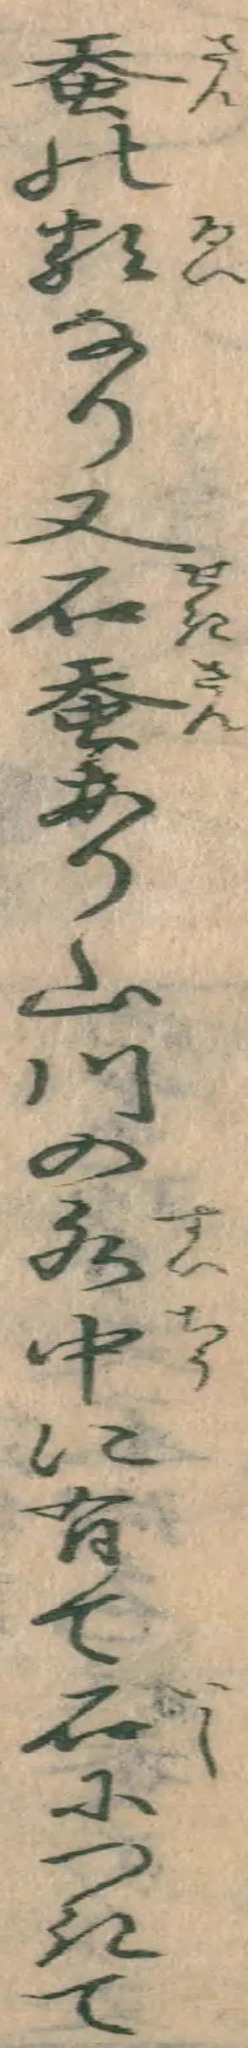蚕の類なり又石蚕あり山川の水中に有て石につきて
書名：養蚕秘録 3巻. [1]
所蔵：国立国会図書館 National Diet Library, JAPAN
